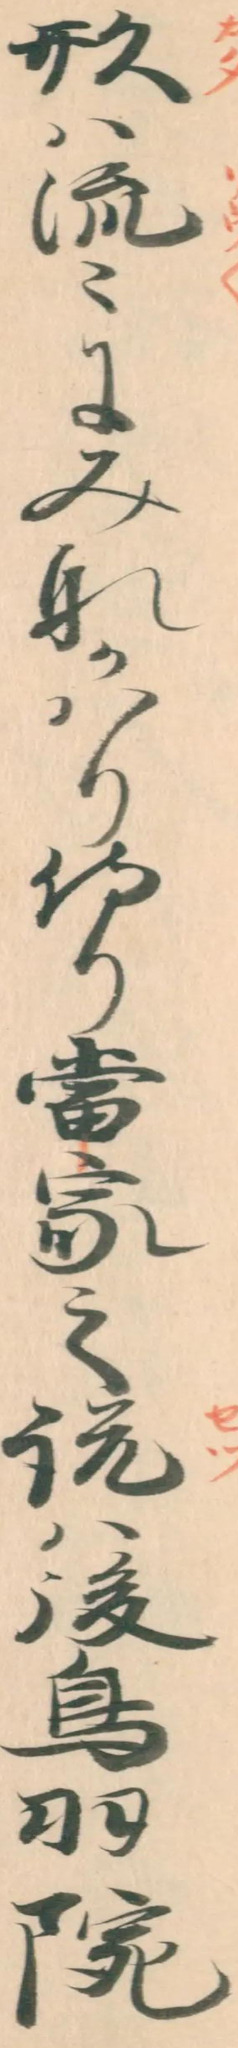形は流々にみなかはり侍り當-家之説は後鳥羽院
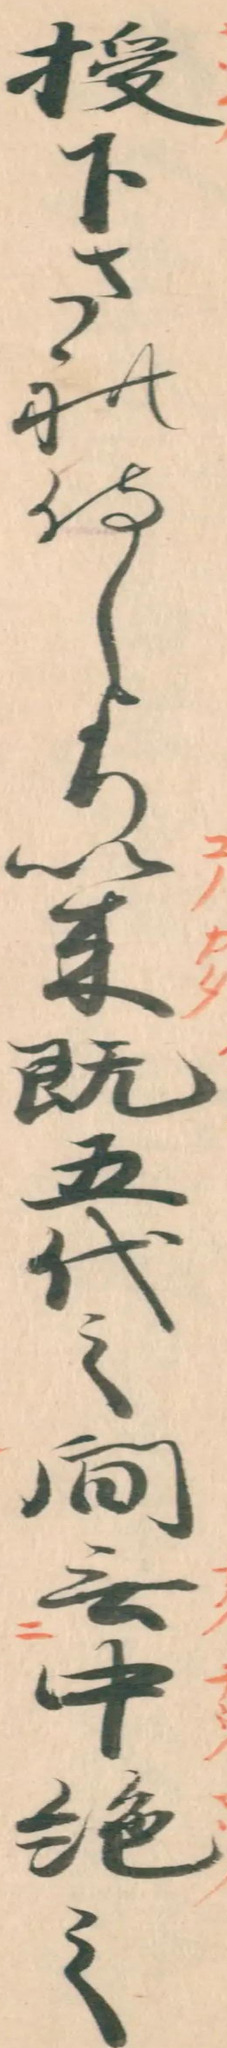授下され侍しより以来既五代之間無中絶之
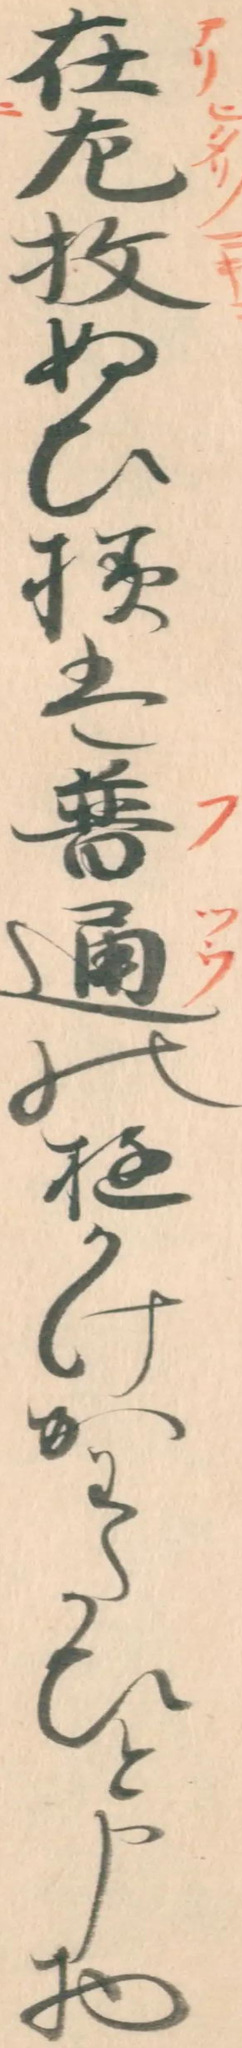在左𢪛ぬひ様は普通のゆかけかわたひと申物
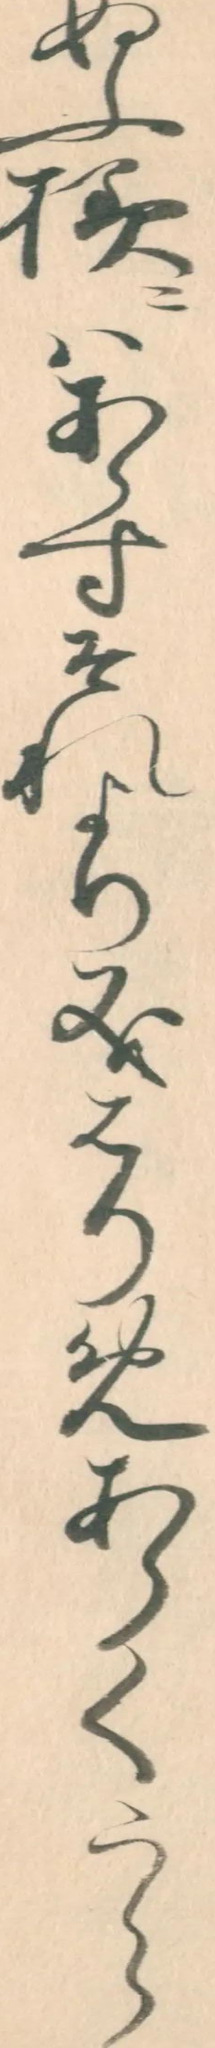ぬふ様にはあらすそれよりはりめあらくうら
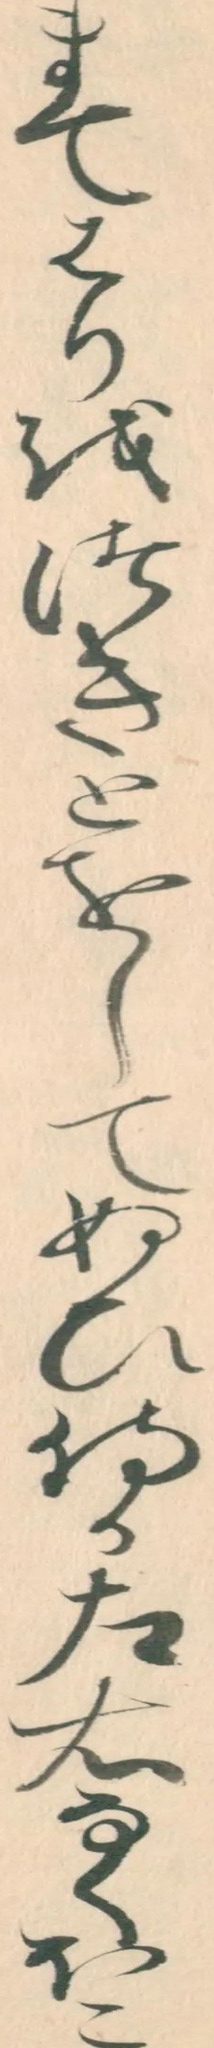まてはりをつきとをしてぬひ侍り左右なくほこ
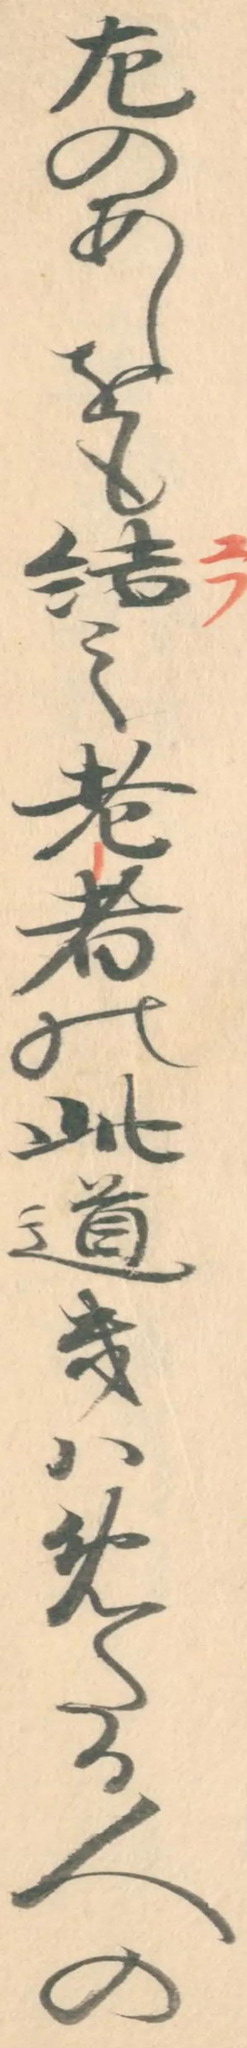左のあしをも結之老-者の此道きはめたる人の

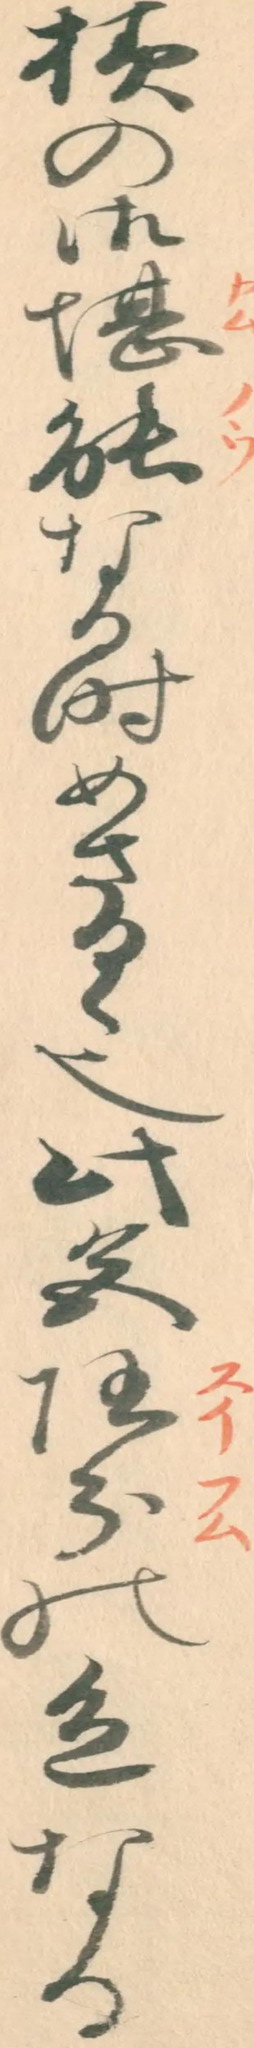様の御堪能なる時めさるゝ也此色随分の色なる
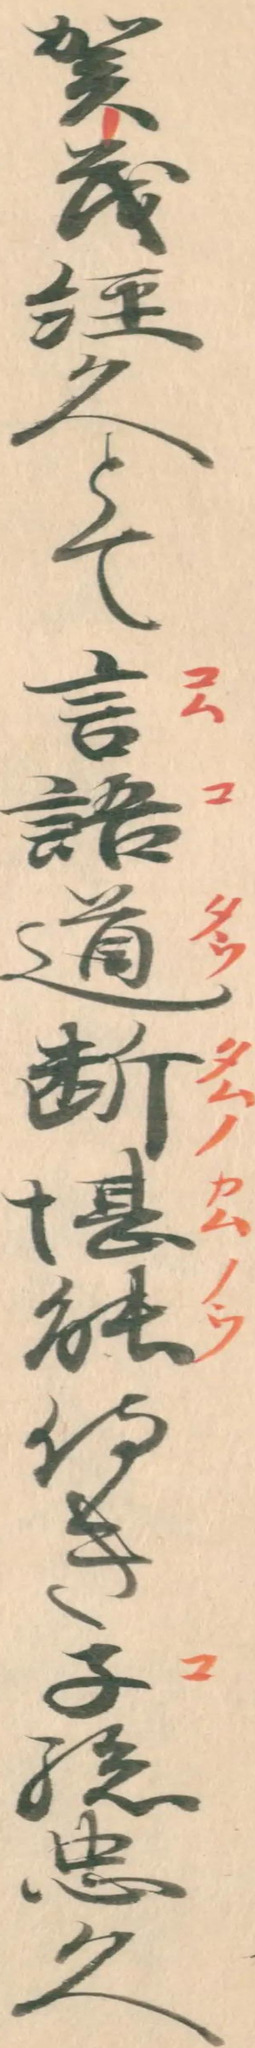賀-茂經久とて言語道断堪能侍き子孫忠久
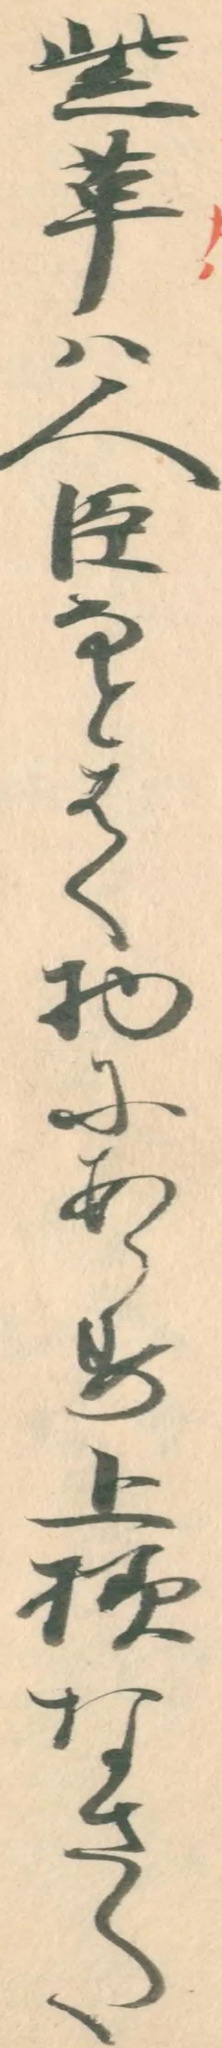紫革は人臣なとはく物にあらす上様なさた

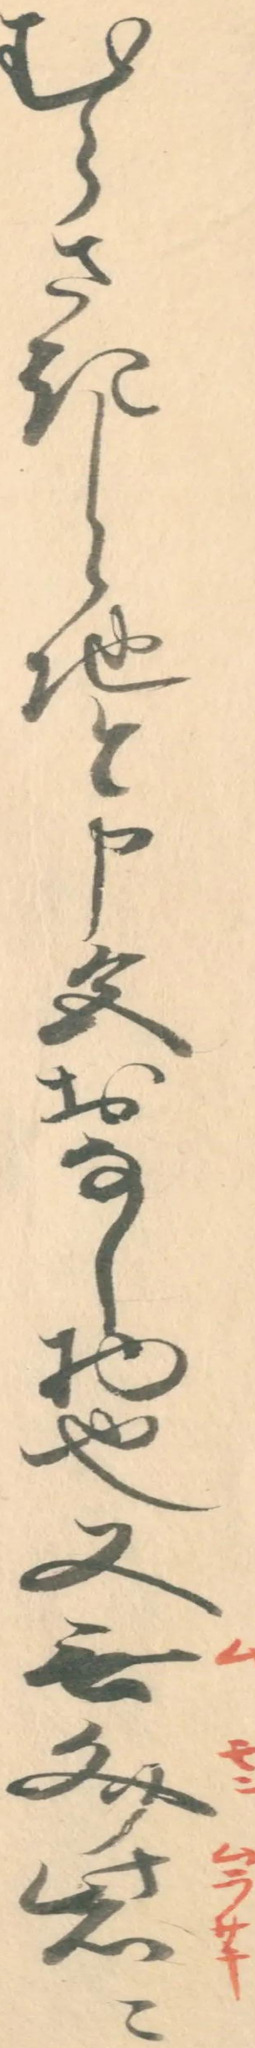むらさきしら地と申色おなし物也又無文紫に
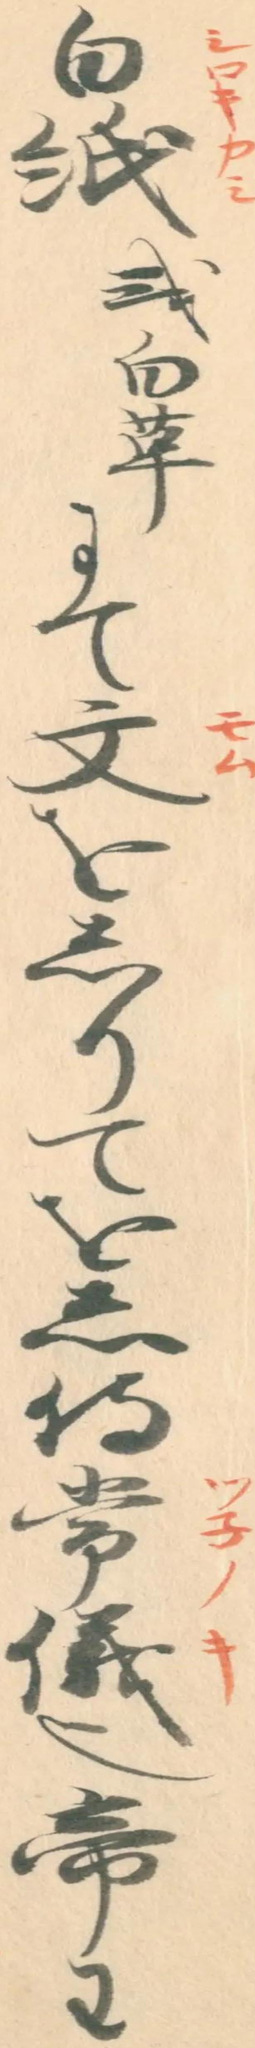白紙或白革にて文をしりてをし侍常儀也帝は
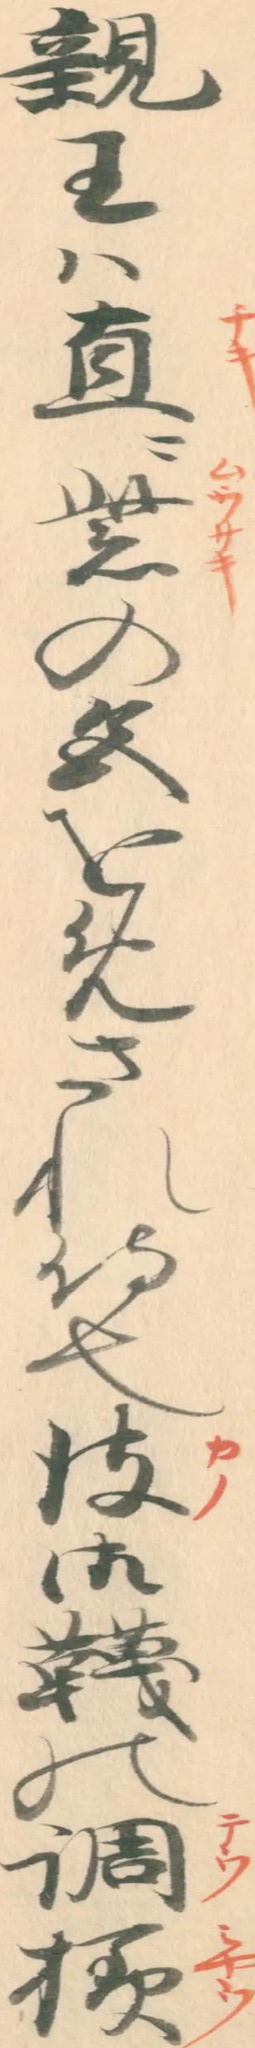親王は直に紫の色をめされ侍也彼御韈の調様
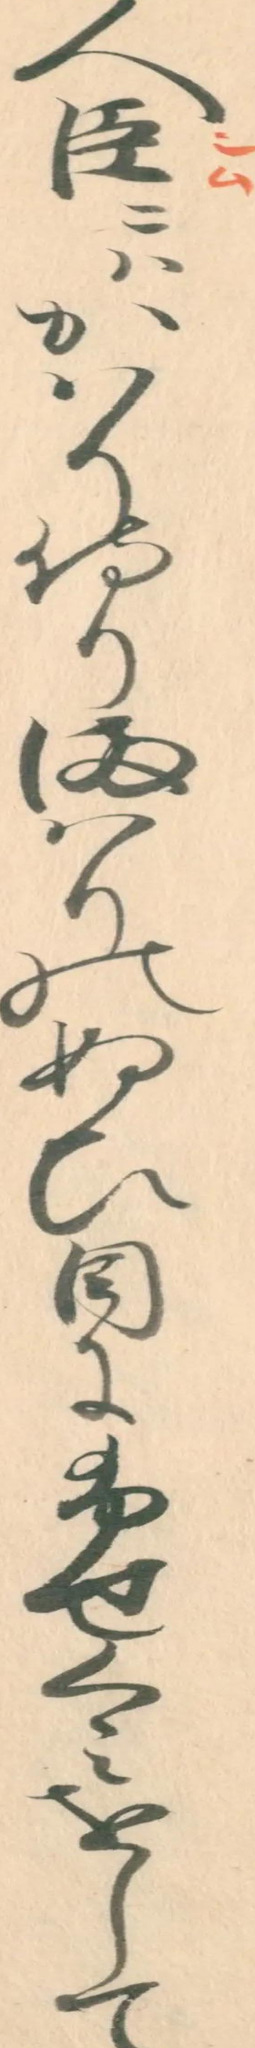人臣にはかはり侍りまはりのぬひ目にふせくみをして
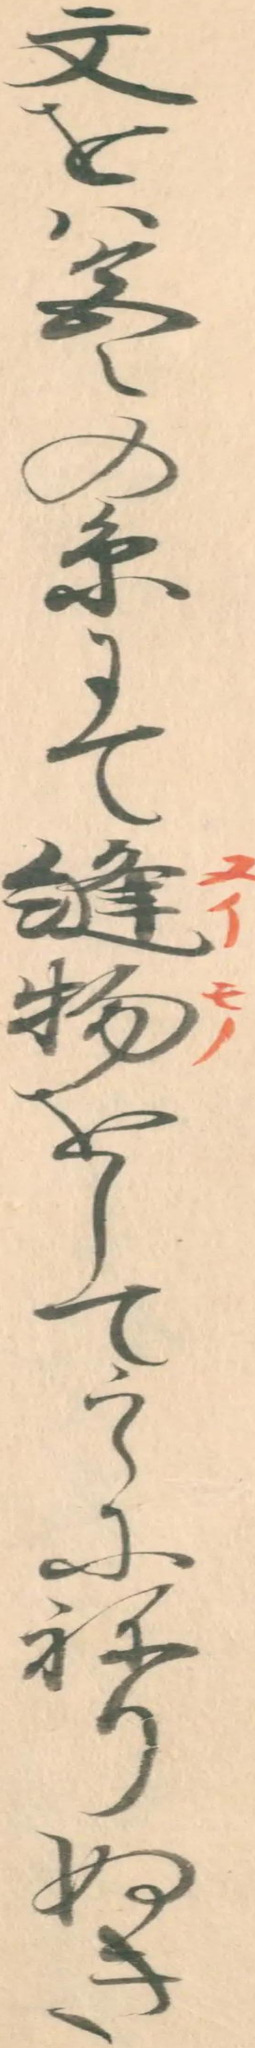文をは色しの糸にて縫物をしてうらにねりぬき
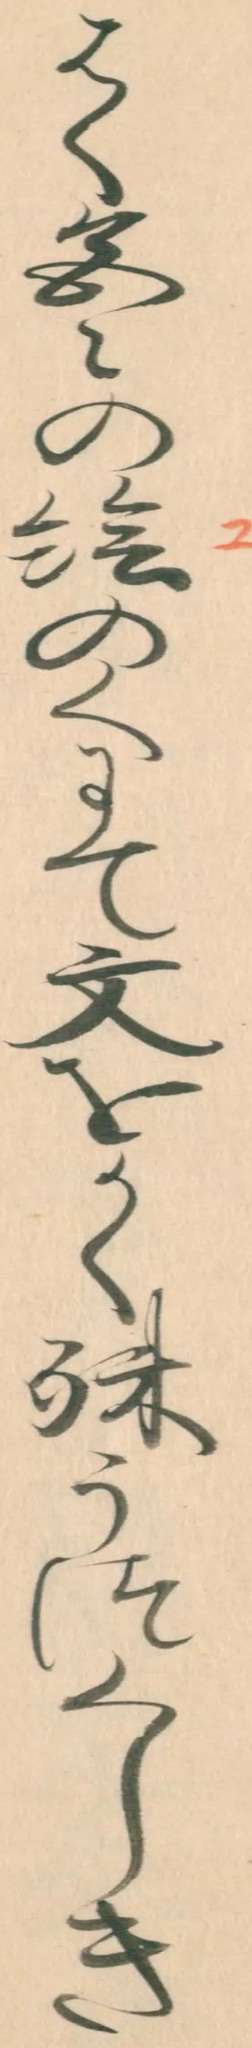はく色々の絵のくにて文をかく殊うつくしき
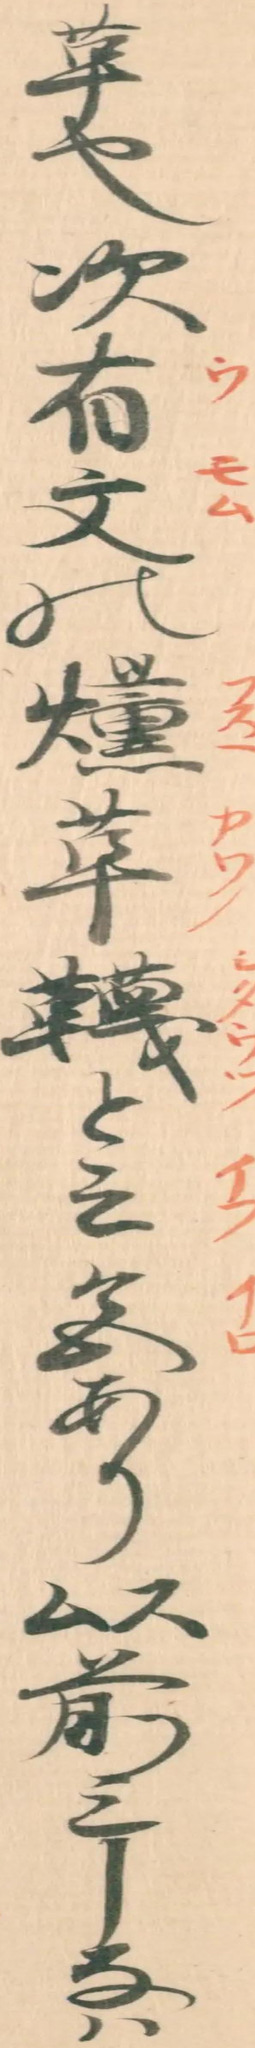革也次有文の燻革韈と云色あり以前三しなは
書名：遊庭秘抄 2巻. [1]
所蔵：国立国会図書館 National Diet Library, JAPAN
